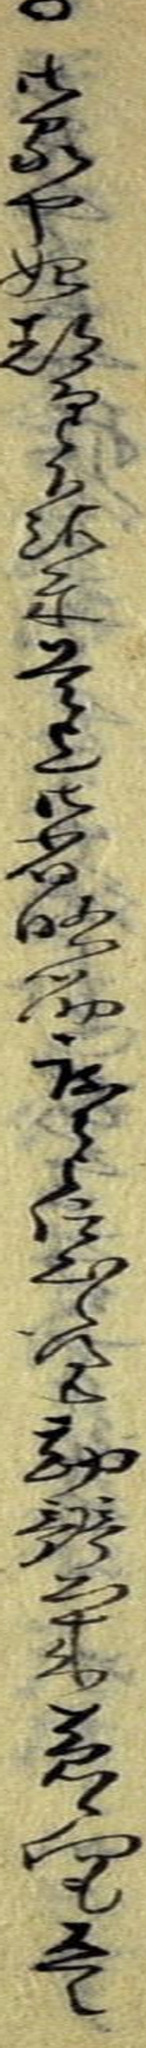○御家中始都而被下銀米是迄御省略筋度々被仰出候得共勘弁出来兼候向も有之
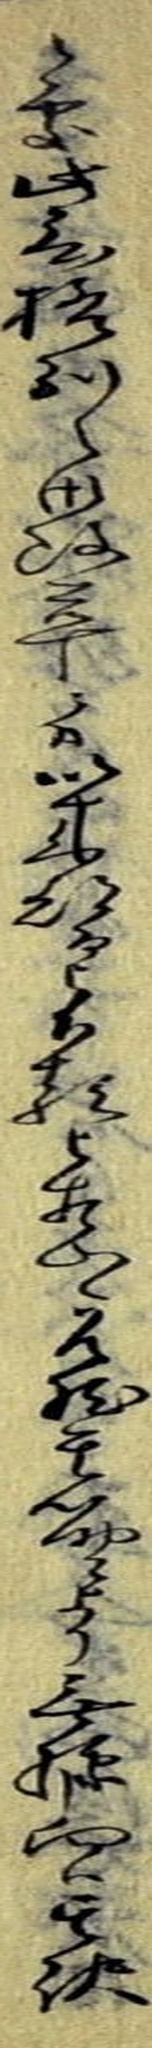候処此度格別之御改革ニ付以来都而被下類被相止候乍然其筋ニより無拠向ハ其訳
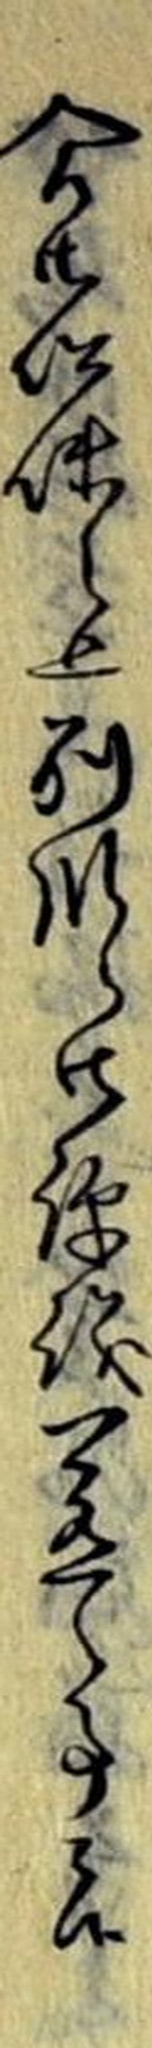合御吟味之上別段之御評議可有候事ニ候
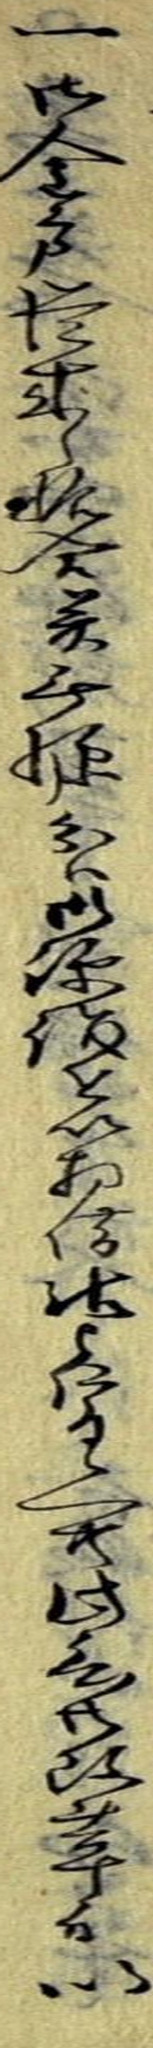一御金方従来之振合并無拠分ハ御評議を以相借銀被仰付候へ共此度御改革ニ付以
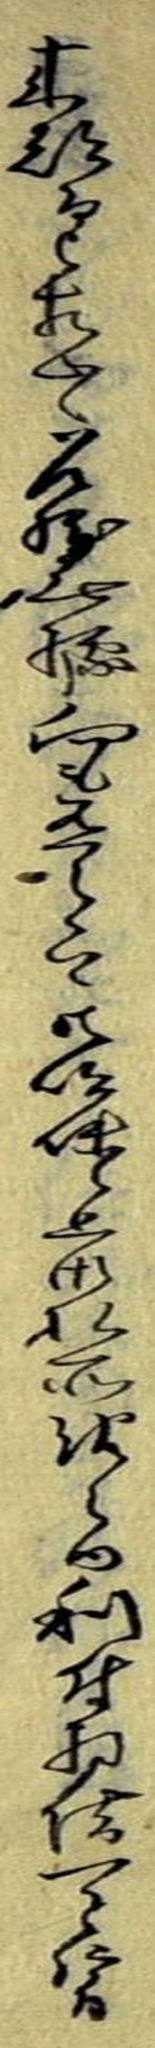来都而被相止候乍然無拠向も有之候ハヽ御吟味之上御札所銀之内利付拝借可被仰付

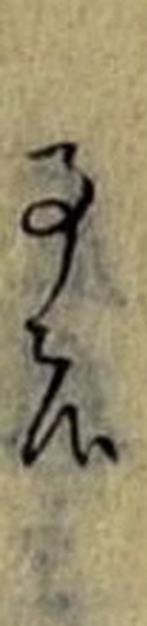事ニ候
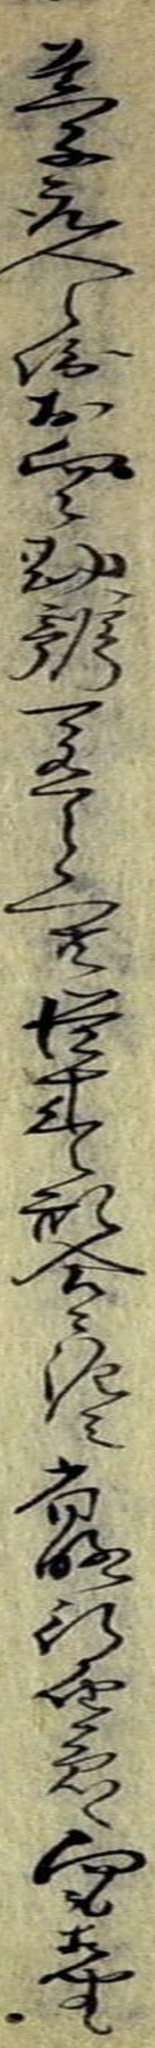○荒子取人之儀於向々勘弁可有之候へ共従来之形合ニ泥ミ省略行届兼候向も相聞候
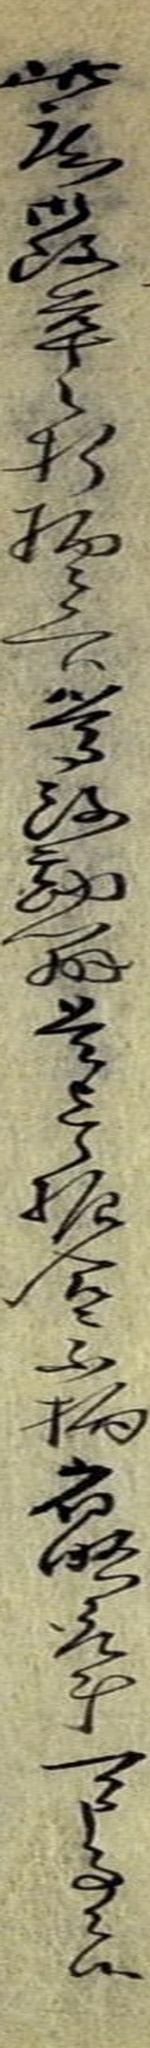此度御改革之折柄ニ候へハ篤致勘弁是迄之振合ニ不拘省略取計可申事ニ候
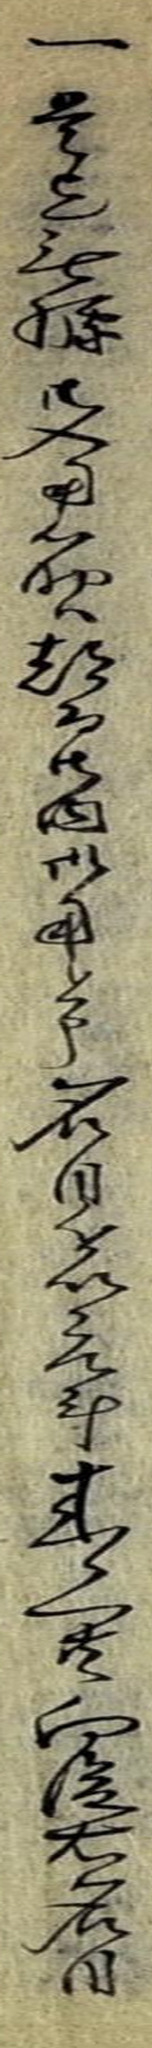一是迄無拠御入用筋ハ都而御内御用と名目を以取計来候へ共向後右名目
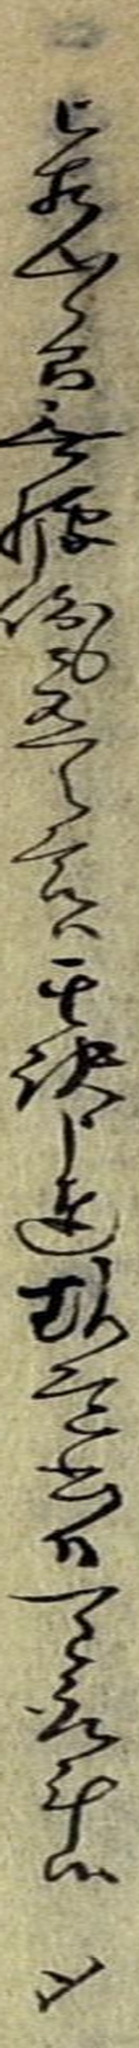被相止候間無拠儀も有之節ハ其訳申達趣意書付可被取計候〆
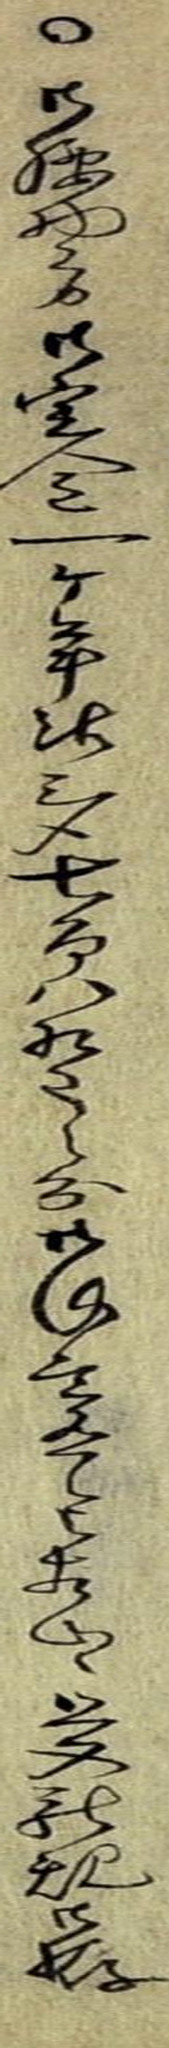○御腰物方御定金一ケ年銀三貫七百八拾匁之分御趣意有之被相止候且又新規御拵
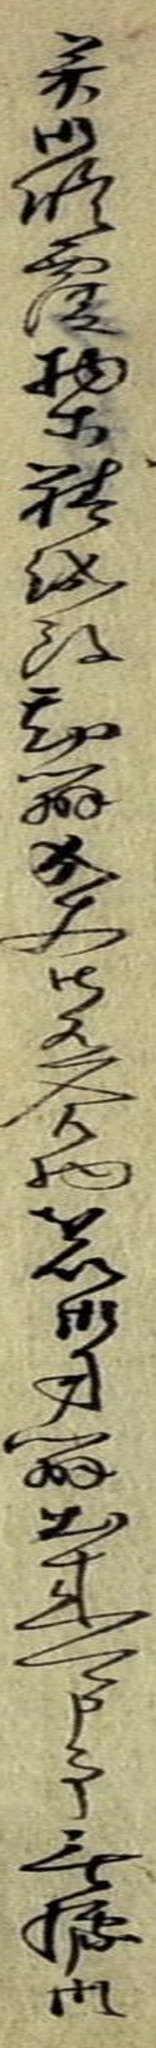并御修覆物等精誠致勘弁成丈御有合物を以御用弁出来可申事無拠御
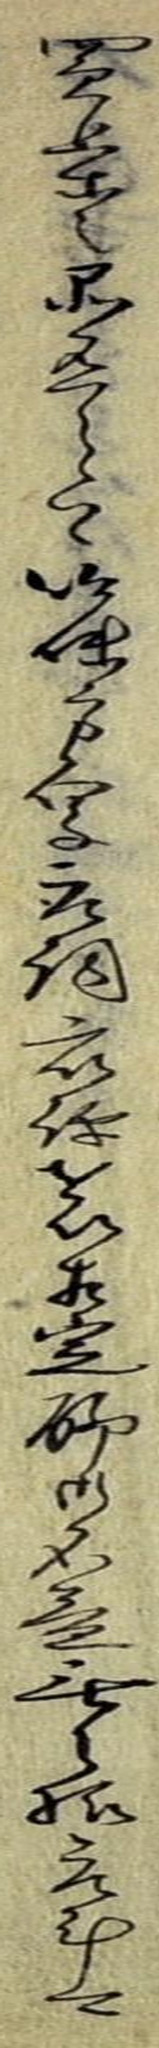買上等品有之候ハヽ吟味方厚取調衆評を以相定聊御不益無之様取計可
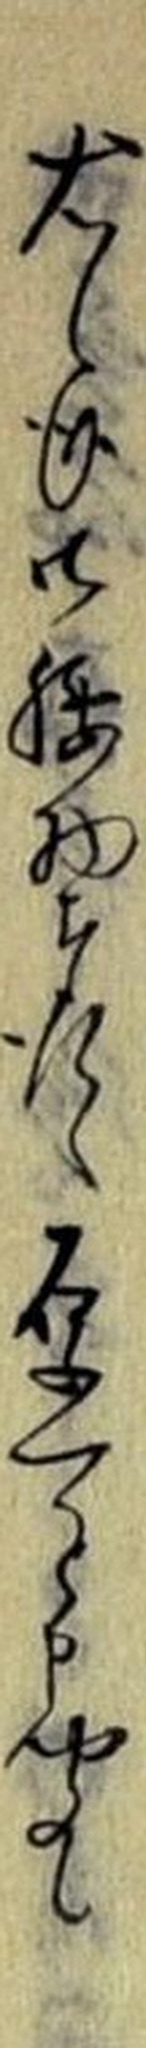右之趣御腰物奉存候厚可申聞候
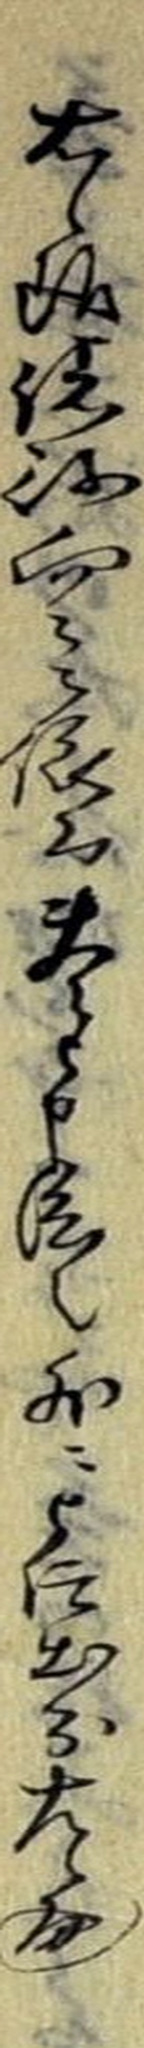右之趣諸役向々ニ依而夫々被申渡之外ニ仰出分左之通
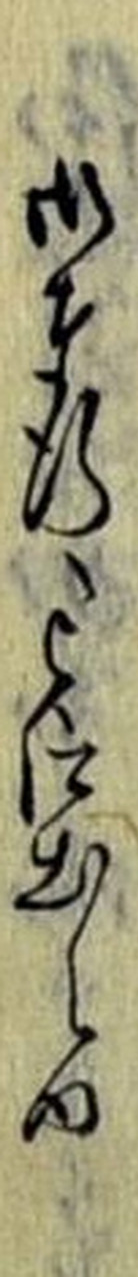御奉行へ被仰出之内
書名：命令之部 五
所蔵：福井県文書館 Fukui Prefectural Archives
